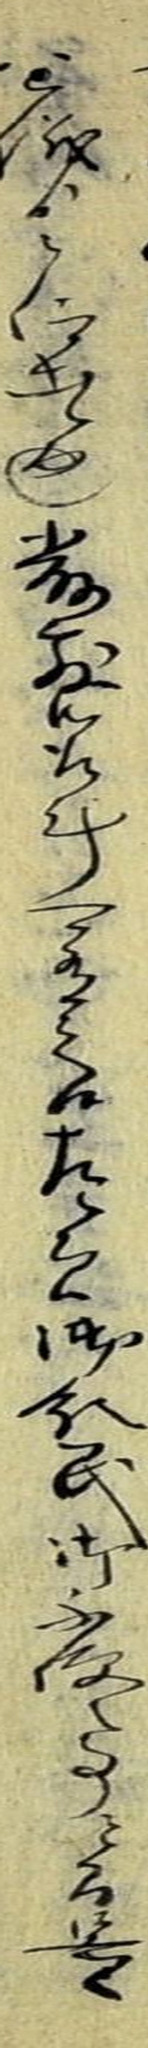公儀ゟ被仰出候通厳敷御取計可有之候左候而は御領民御不便之事に候間呉々
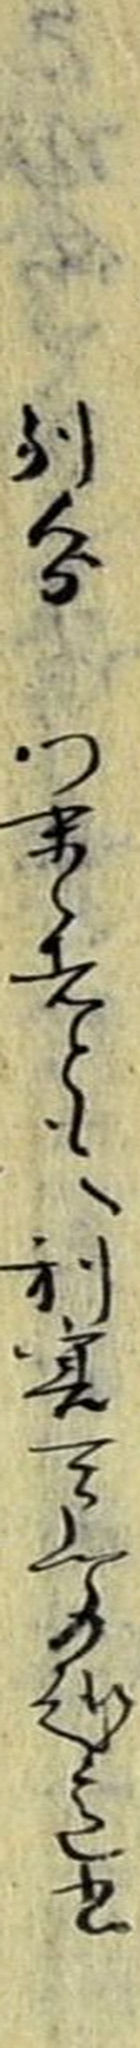別紙門末之者ともへ利害可申聞趣意書
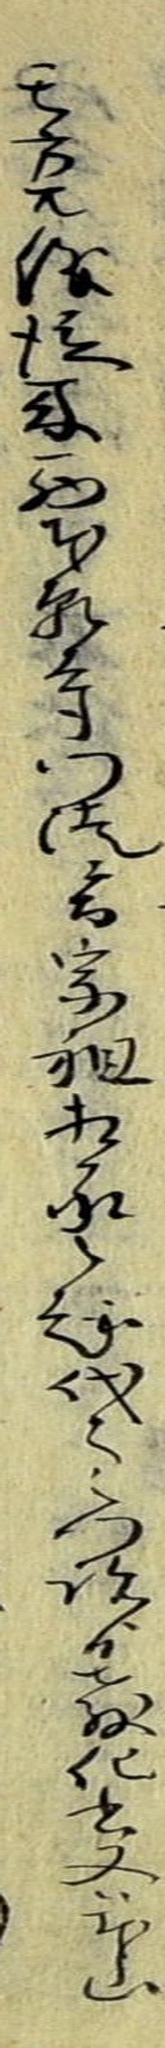其方共儀従來西本願寺門徒に而宗祖相承候趣代々之門跡ゟ教化書又は本山
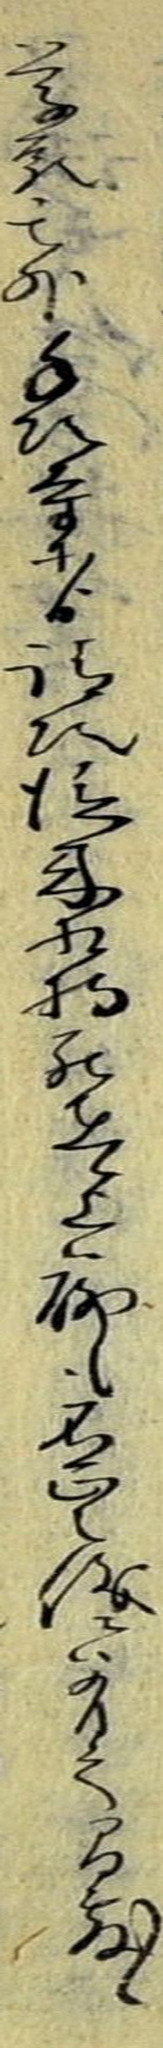学頭其外手次寺ゟ請次従來相持罷在候上候上は聊も不正之儀には有之間敷候
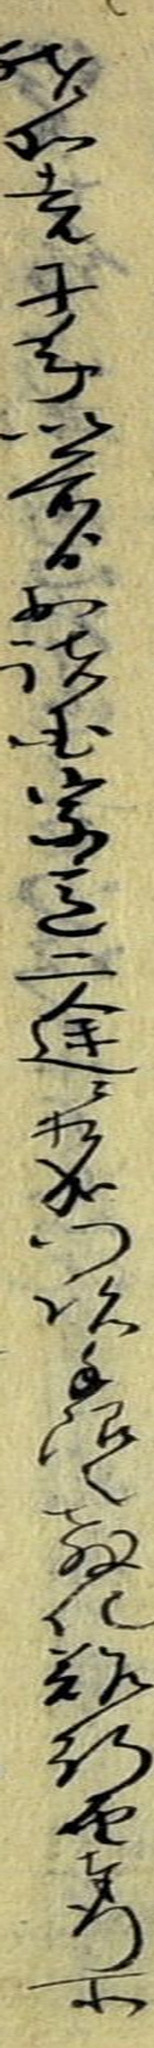然処去ル子年以前ゟ於諸国宗意二途に相成門跡手限之教化難行届奉行所
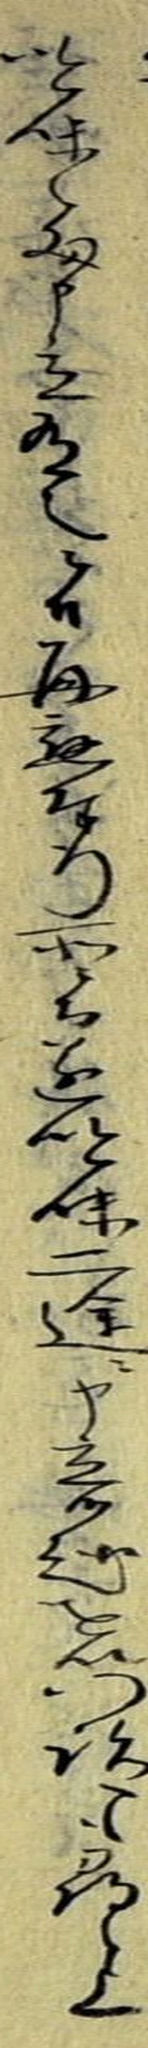吟味之義申立有之に付再応奉行所に而遂吟味二途に申立候趣を以門跡へも尋候上

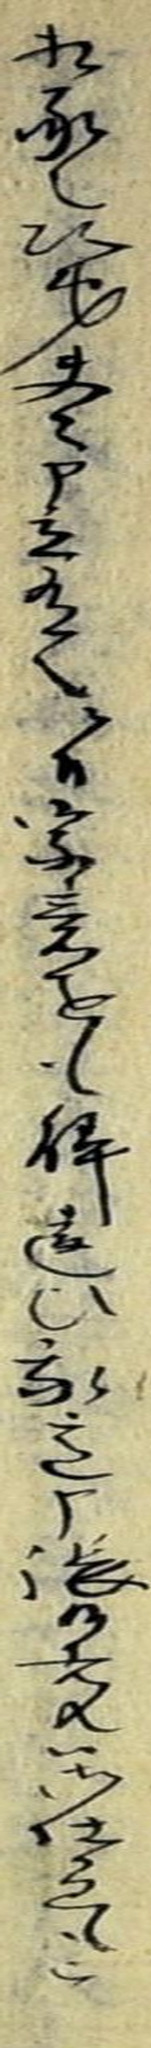相承候次第夫々申立有之付宗意をも解違ひ我意申張候者共は御仕置も被
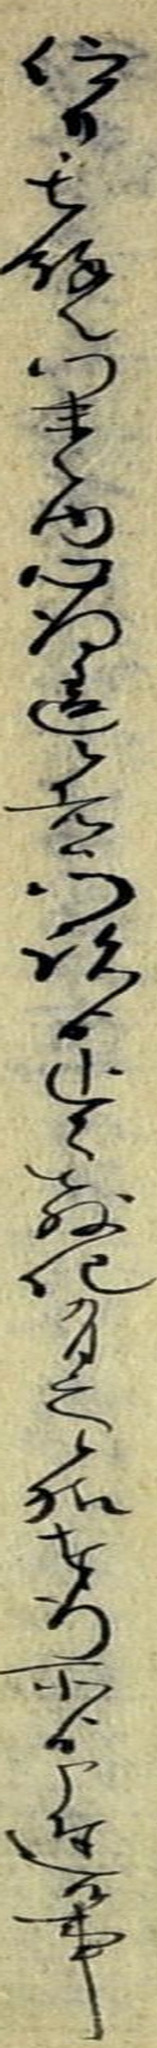仰付其餘之門末之内心得違之者は門跡ゟ追々教化有之候様奉行所ゟ申達候事
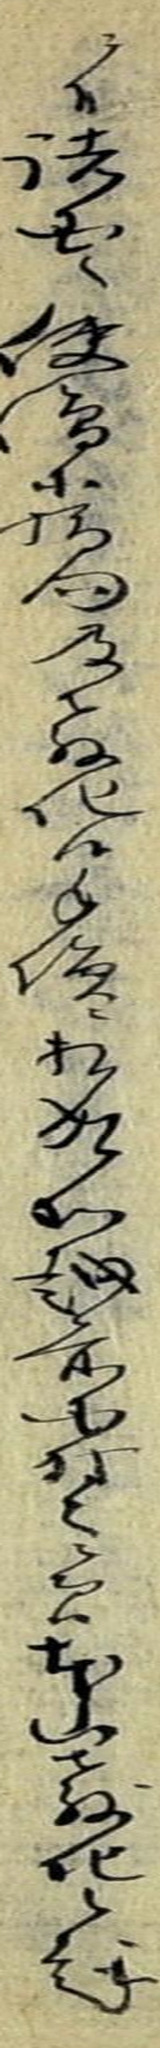に付諸国之使僧等指向及教化候手続に相成候処越前国村々に而は本山教化之趣
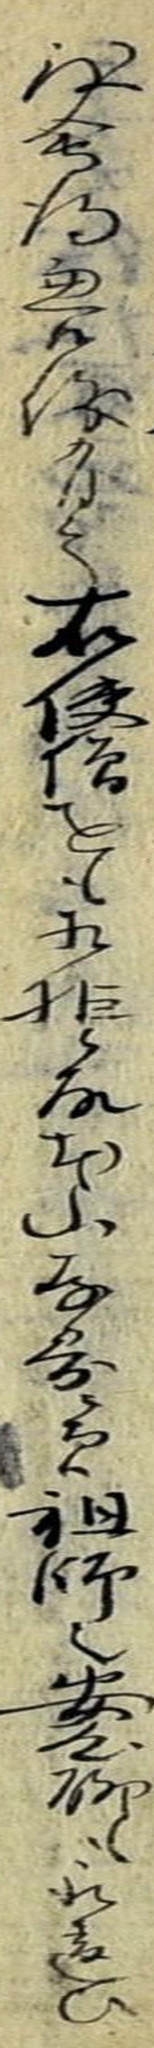致会得兼候儀有之右使僧をも相拒候故本山存寄に而は祖師之安心聊も取違ひ
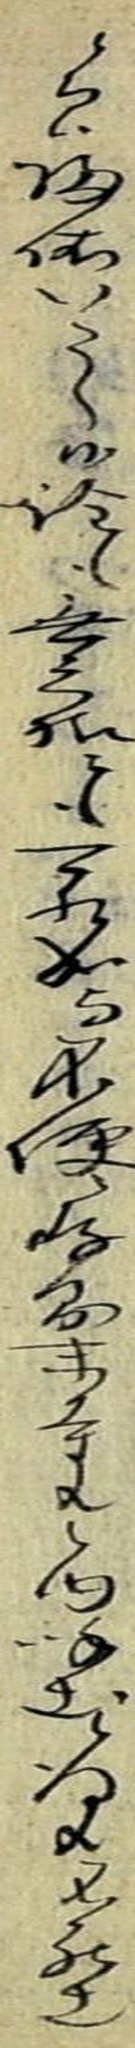に而は帰依いたし候證も無之様にも可相成と不便に存則末寺共之内呼出候得共不罷出
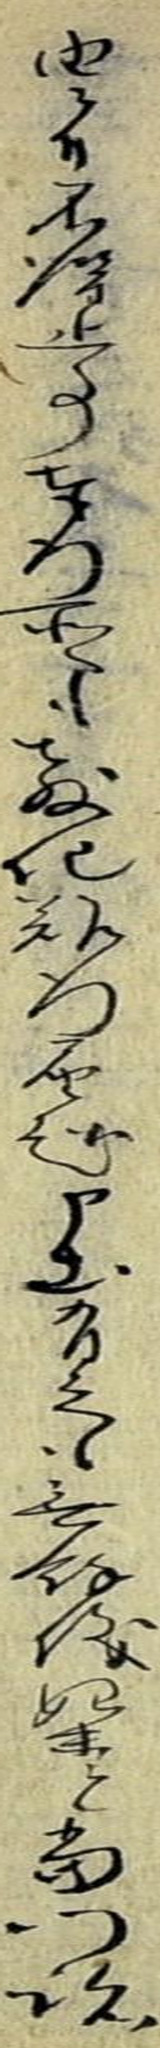由に付不得止事奉行所へも教化難行届候趣申出有之も無余儀始末に候当門跡
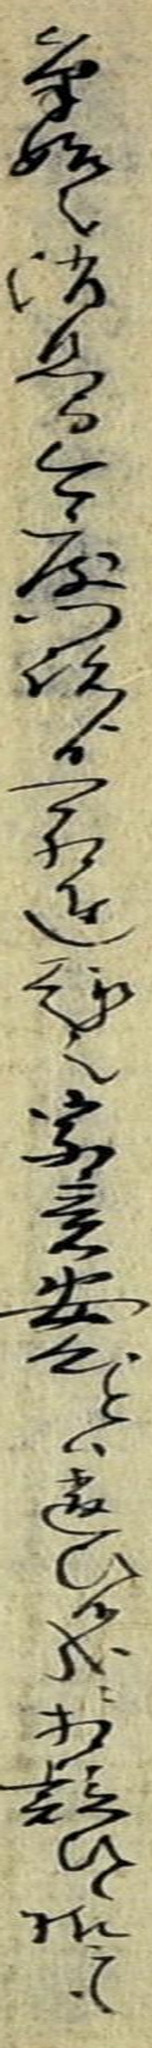争始之消息と今度門跡ゟ可相達趣之宗意安心とは違ひ候哉に相疑候様にも
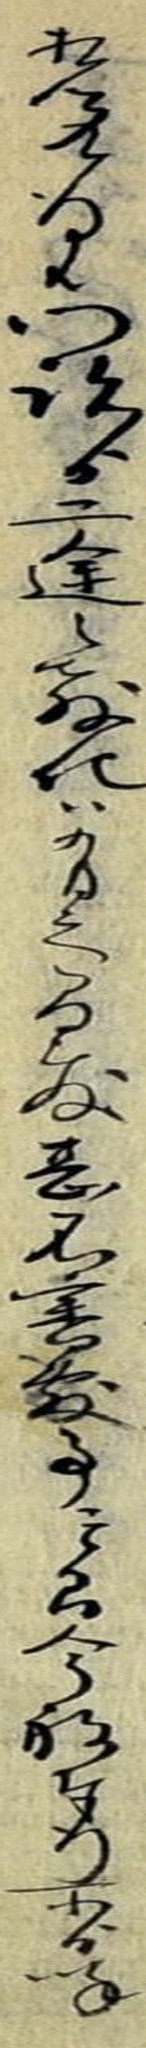相聞候得共門跡ゟ二途之教化は有之間敷甚不審致事に候間今般奉行所ゟ呼
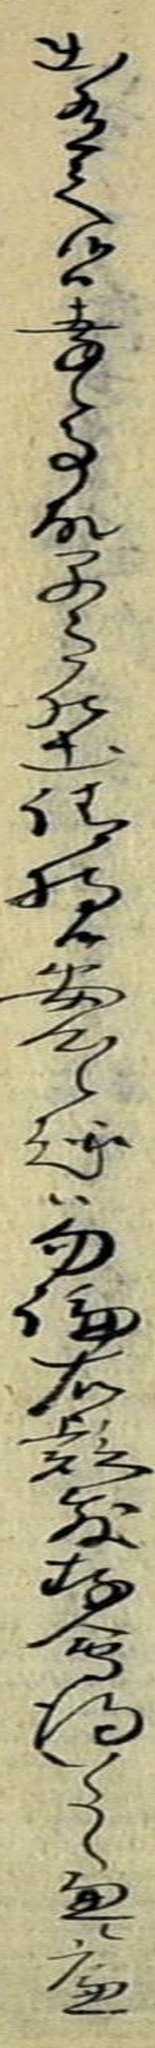出有之候は幸候事故早々罷出請持候安心之趣は勿論右疑敷存会得いたし兼候廉
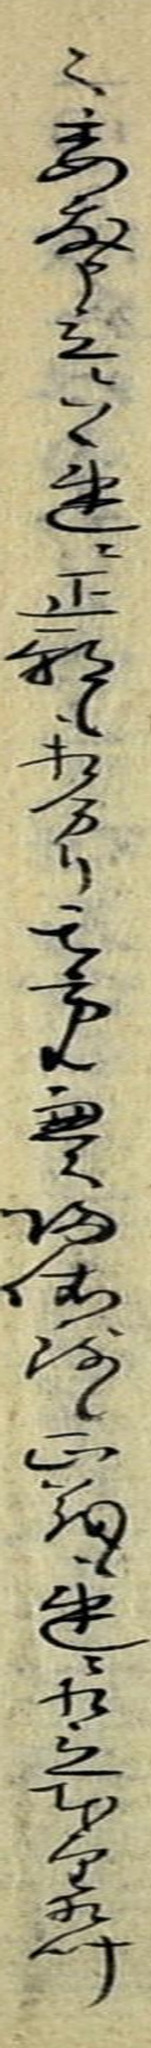々委敷申立候はヽ速に正邪も相分り其方共兼而帰依致し候正義も速に相立本望相叶
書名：命令之部 四
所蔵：福井県文書館 Fukui Prefectural Archives
